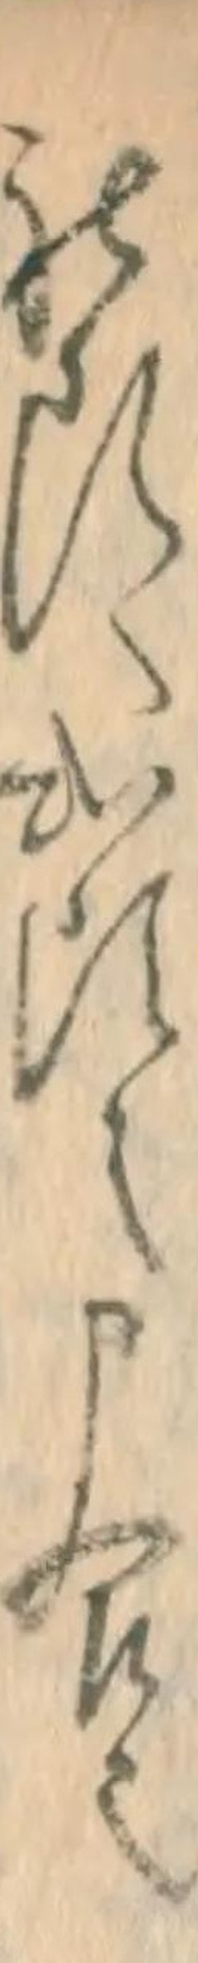社頭へ出頭之申合也
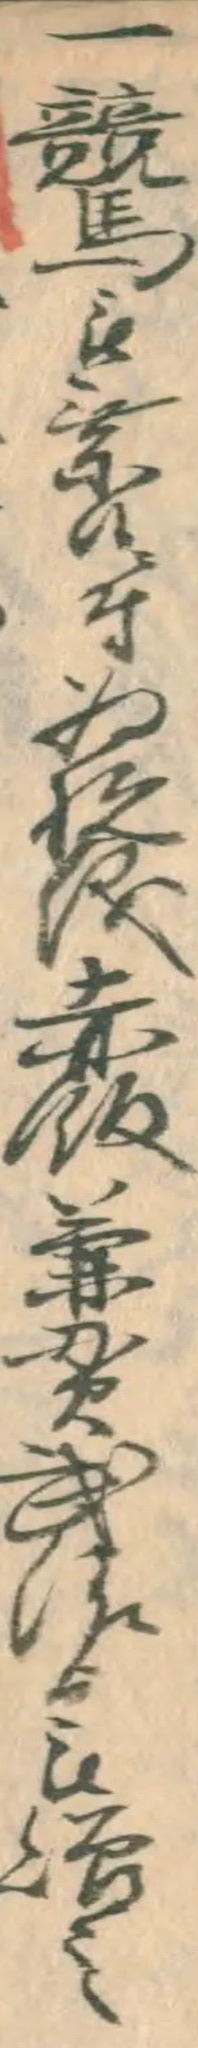一競馬被乗候ニ付為祝儀赤飯兼貫武清ゟ被贈之
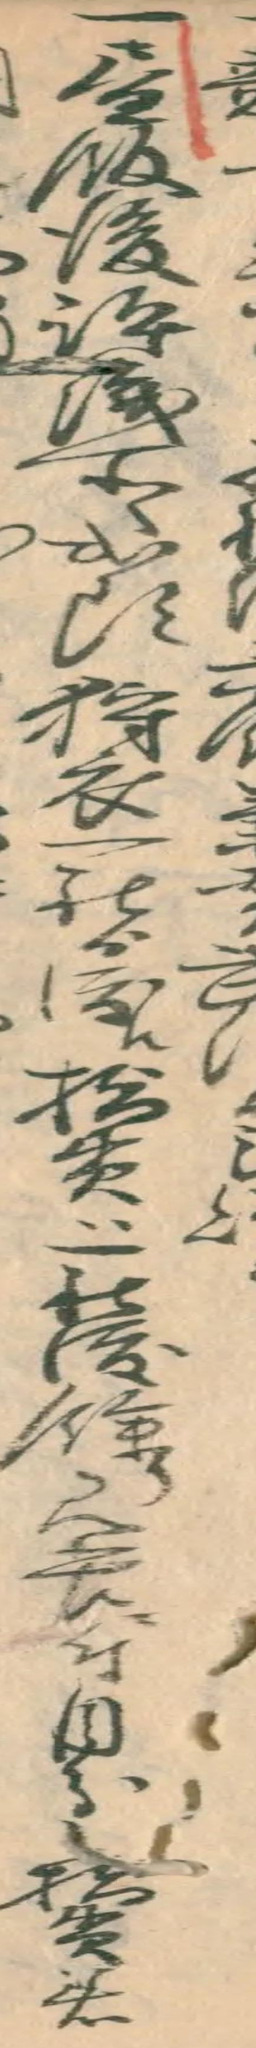一昼飯後評議所へ出頭狩衣一社ゟ渡ル指貫ハ一社渡余り見苦ニ付自分之指貫着
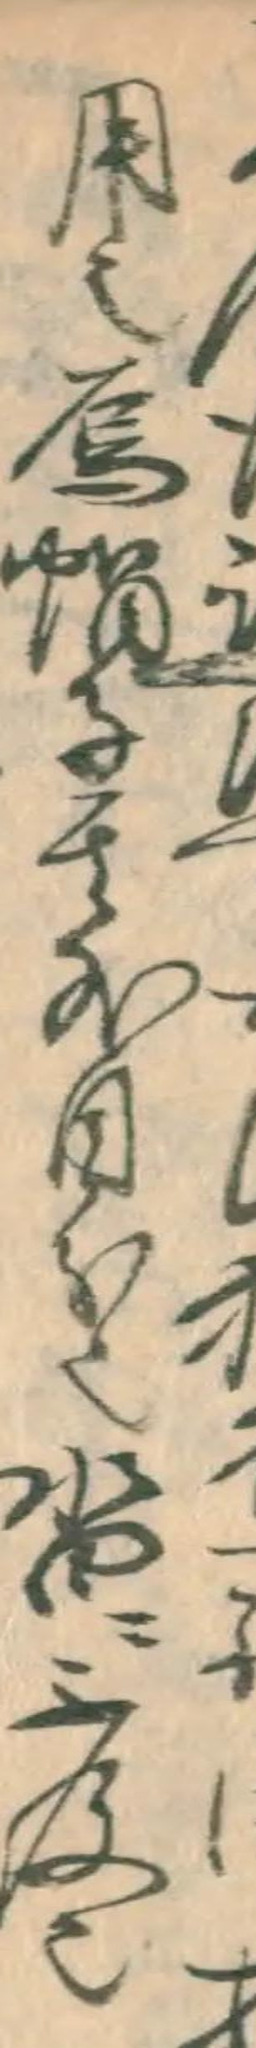用也烏帽子其外自分也沓ニ不及也
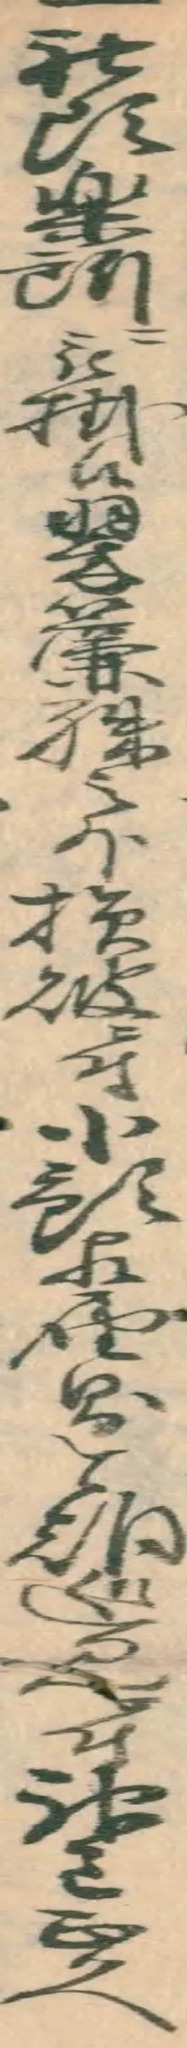一社頭楽所ニ被掛候翠簾殊之外損破ニ付小預相届則今朝巡見ニ付神主正久
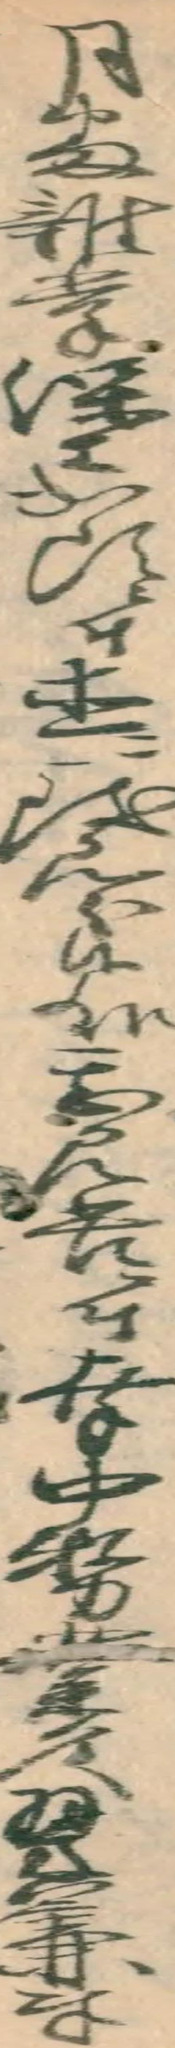月番雑掌保土出頭ニ付直ニ致見分候処甚見苦ニ付幸中務業久翠簾奉
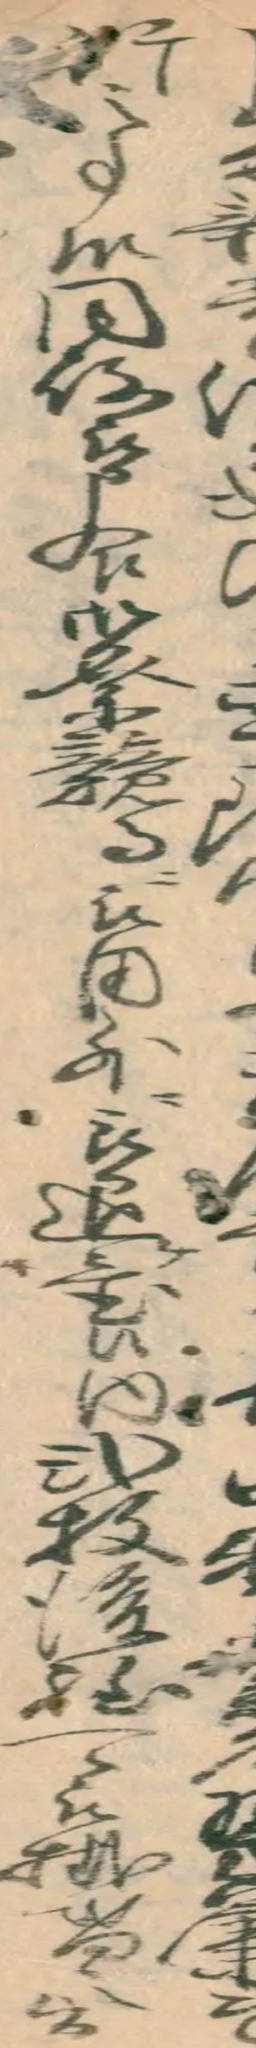行之事故同役被申合御祭競馬ニ被用外ニ被退ケ置候内弐枚後程可被掛替之旨
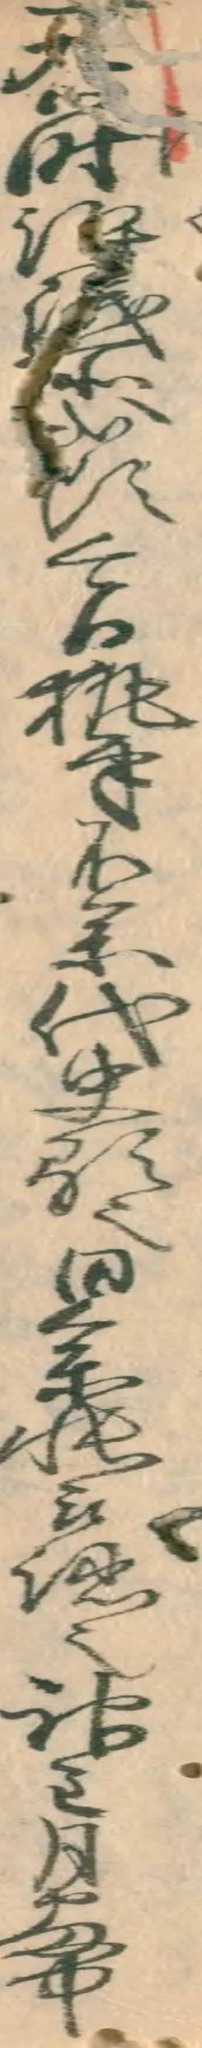一九ツ時評議所へ出頭今日執筆不参代史顕也日参帳被認也神主月番中
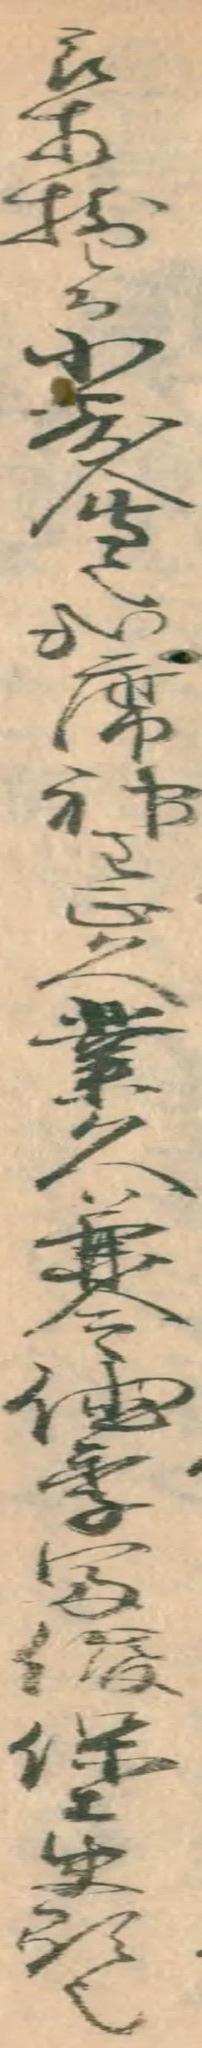被相揃候而小寄会也出席神主正久業久兼令徳季富俊保土史顕也
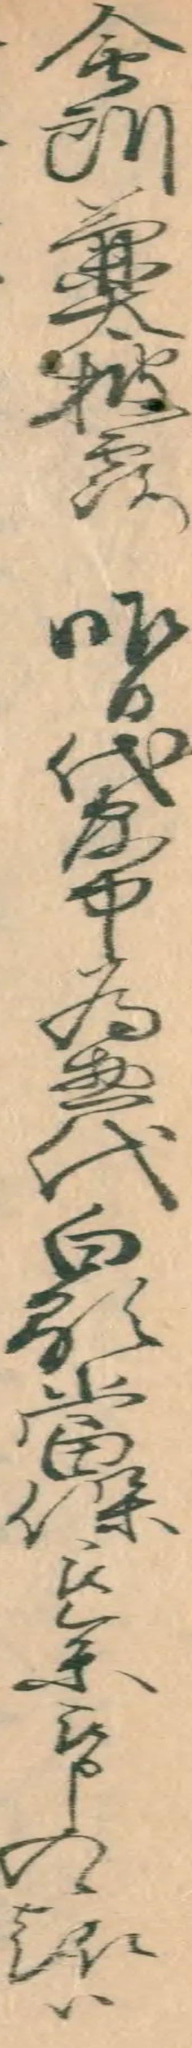会所兼太披露昨日代官中為惣代白顕当保被参被申入候趣ハ
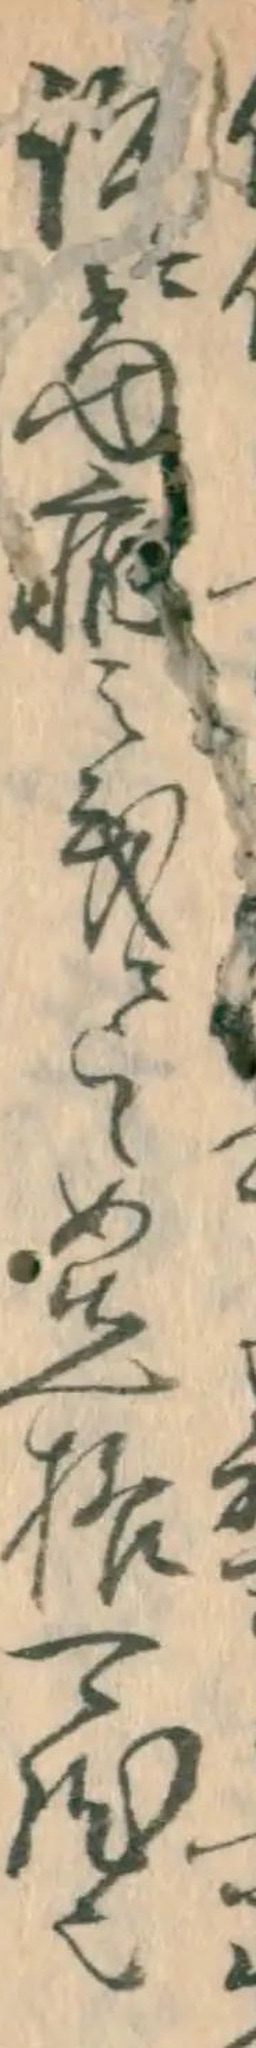評ニ当病之義ニ候ハヽ如先格可然也
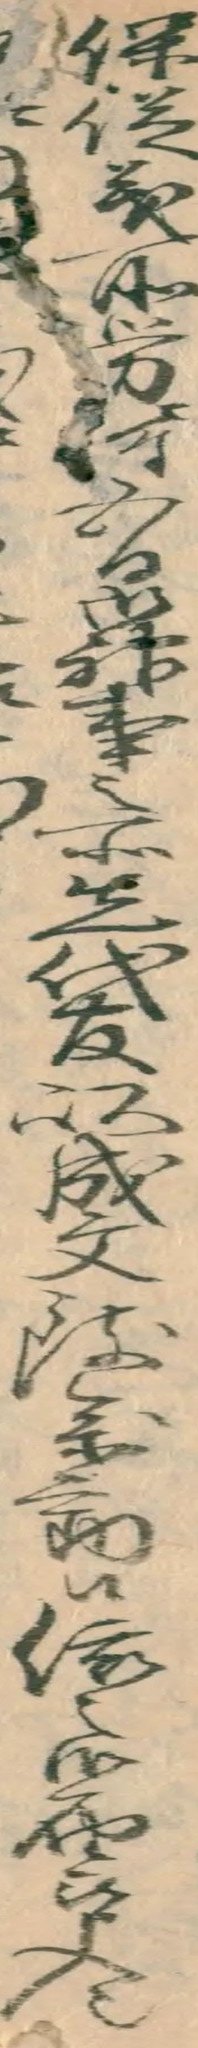保従義所労ニ付五日御神事之所先代官以成文致参勤候依之御届被申入也
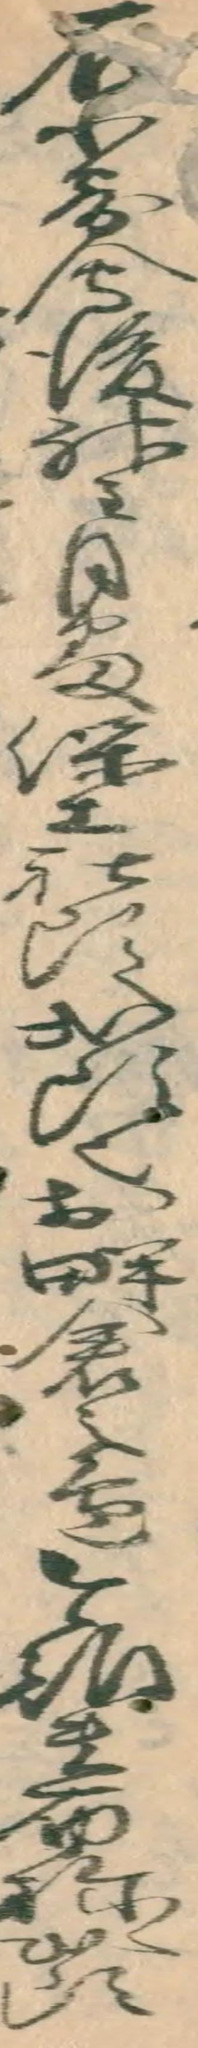一右小寄会後神主月番保土社頭へ出頭也於畔倉之辺今朝貴布祢へ出頭
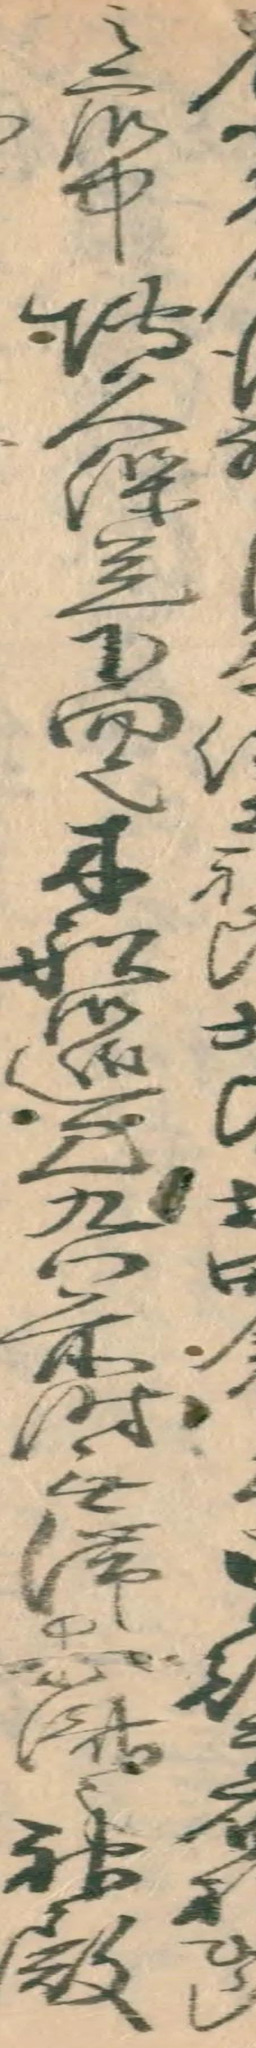之衆中博久保覚下向也木船御巡見九ツ前時無滞相済也神殿
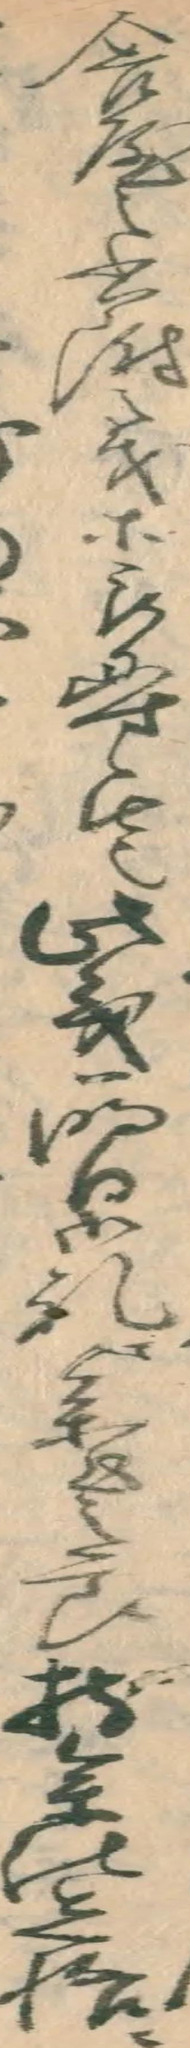舎屋之書付之義等被尋候由也此義ハ明日御礼ニ参上之節持参仕先格ニ
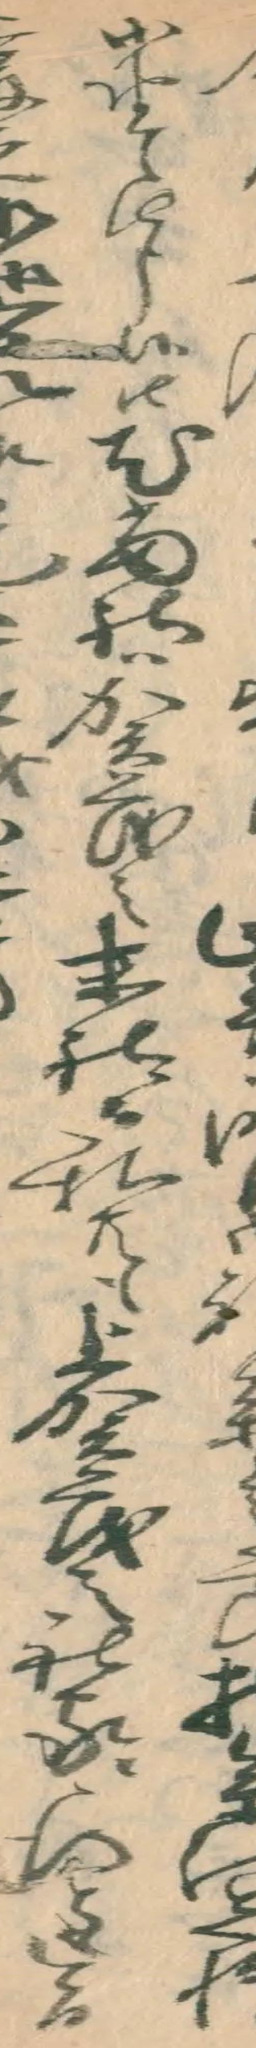御座候由申候由尤当社ハ賀茂之末社ニ而私共も上賀茂之社家ニ候得とも今日
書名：賀茂社記録. 第58冊
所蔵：国立国会図書館 National Diet Library, JAPAN
